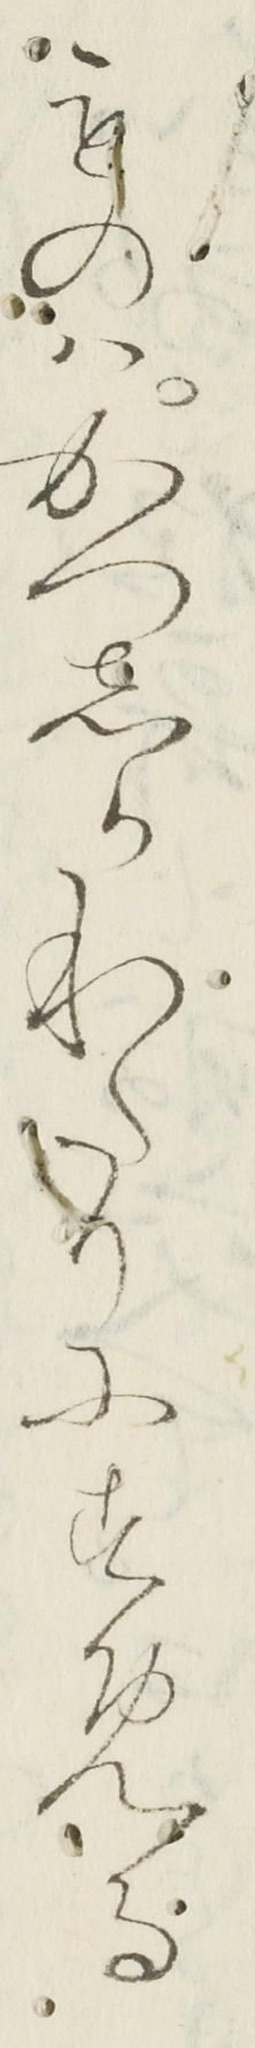ものハかつわりわしににすめる
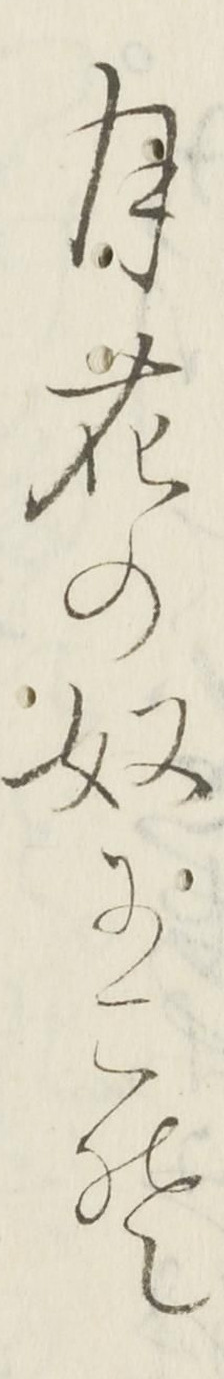月花の奴にこそ
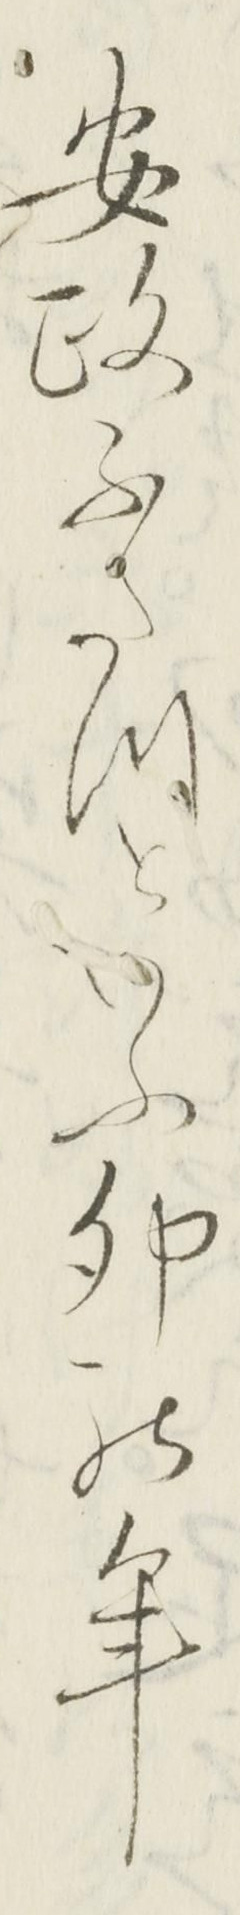安政ふた川といふ卯の年
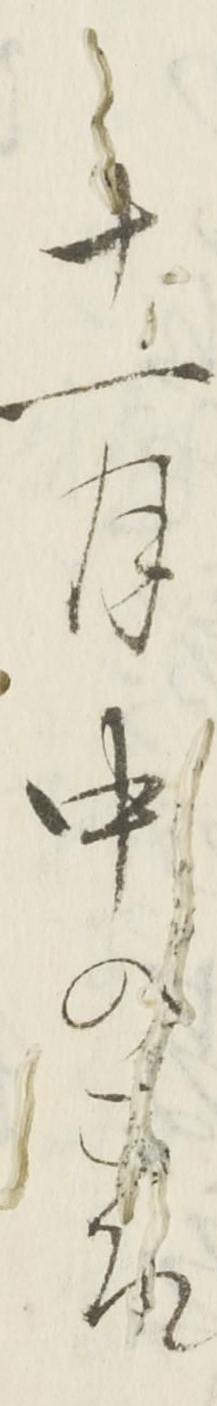十一月中のころ
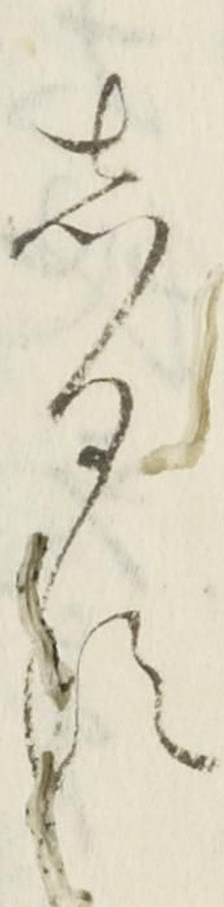しるす
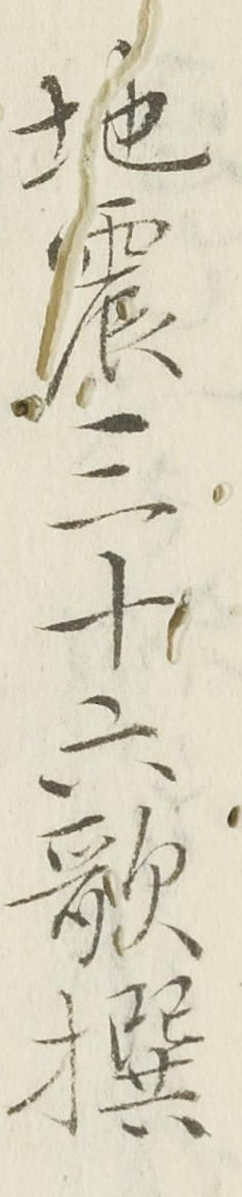地震三十六歌撰
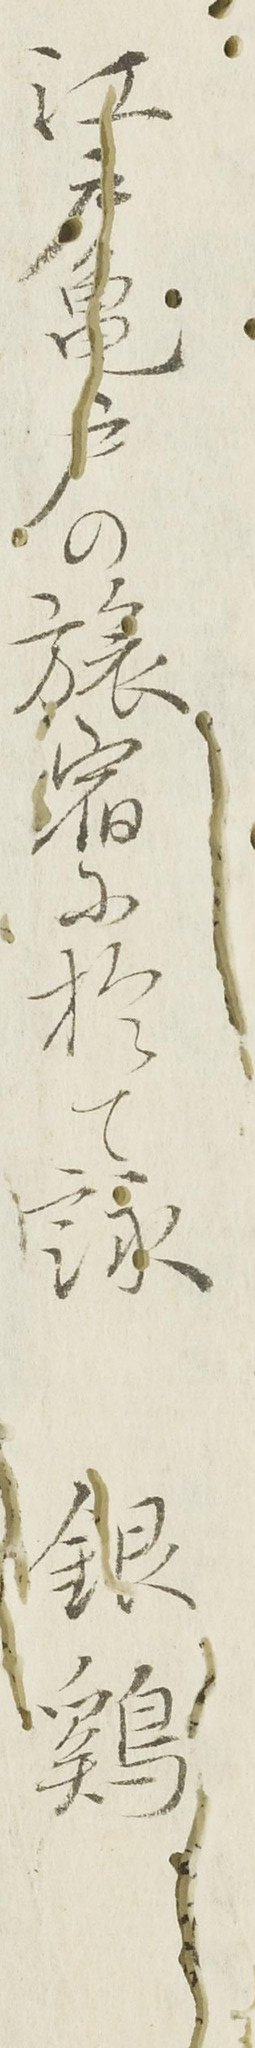江戸亀戸の旅宿に於て詠銀鶏
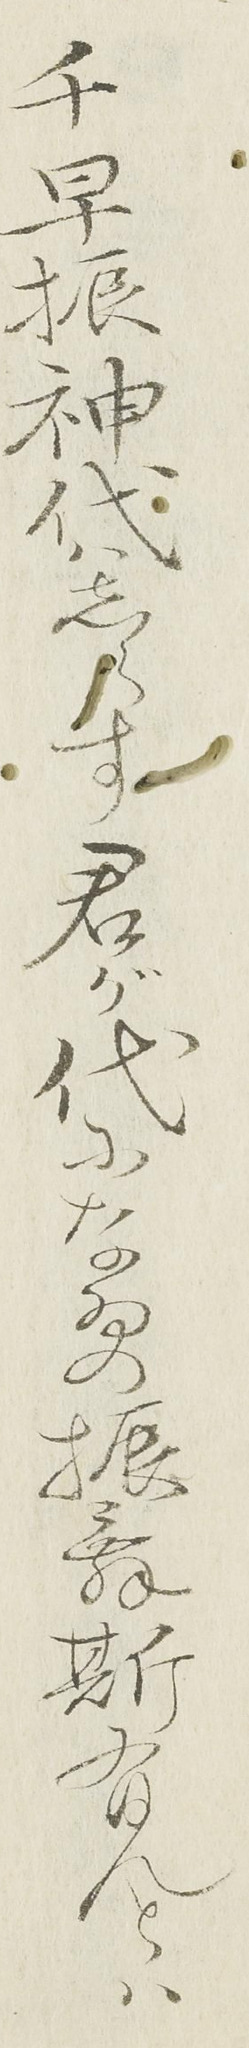千早振神代ハしらす君が代になゐの振舞斯有んとハ
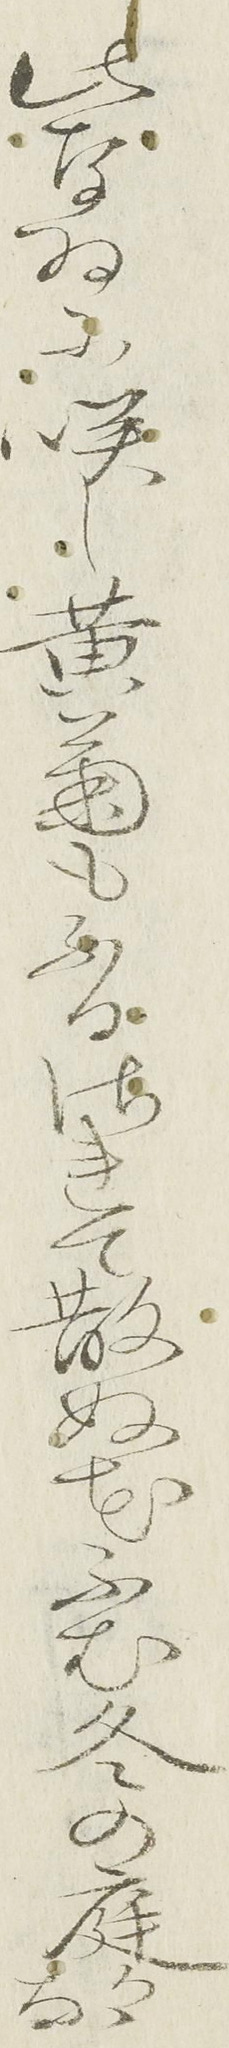皆なゐに咲し黄菊もふるされて散ぬ花ふむ冬の庭かな
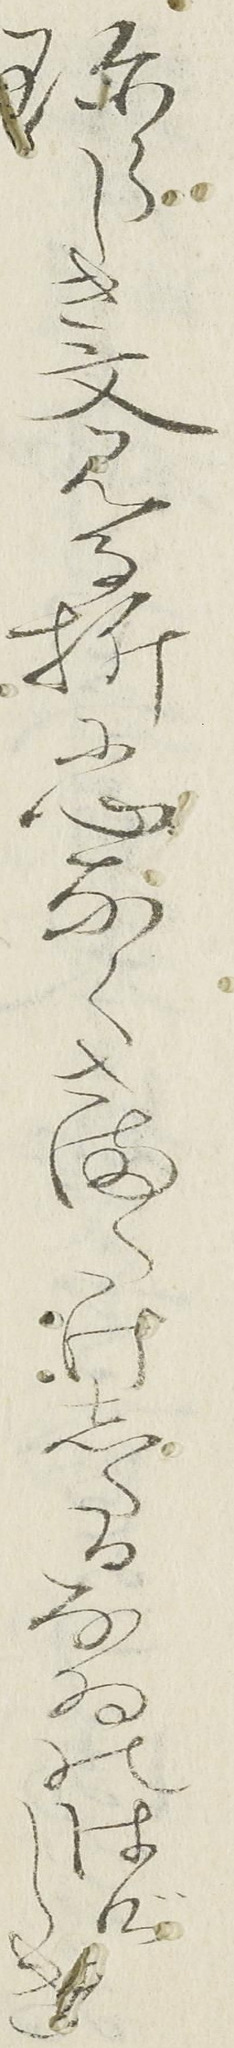珍らしき文見る折に心なくさまたげしたるなゐのはげしき
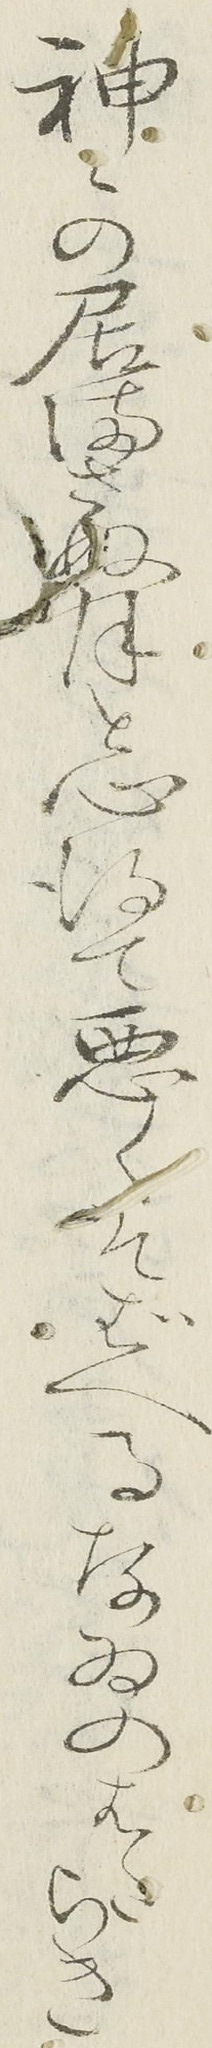神々の居まさぬ月と心得て悪くそばへるなゐのはたらき
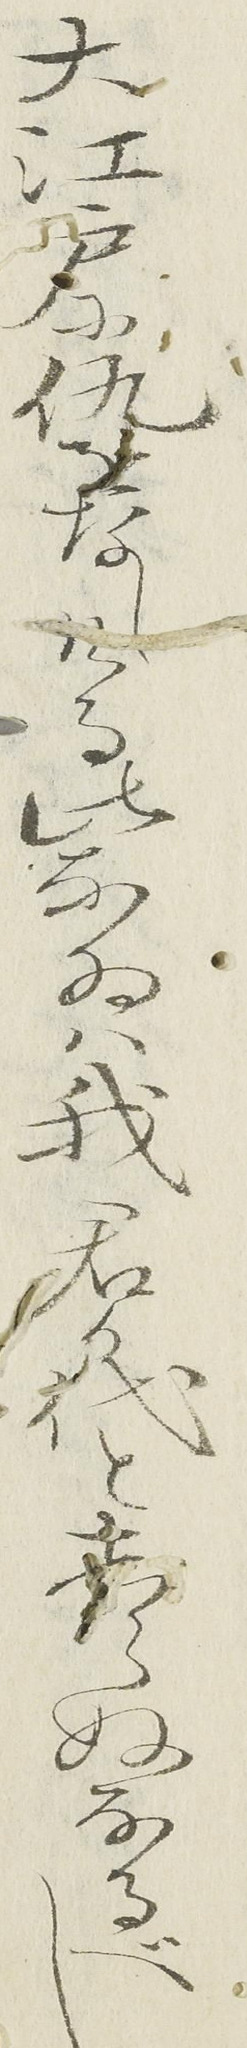大江戸に仇をなしける此なゐハ我君か代と考らぬなるべし

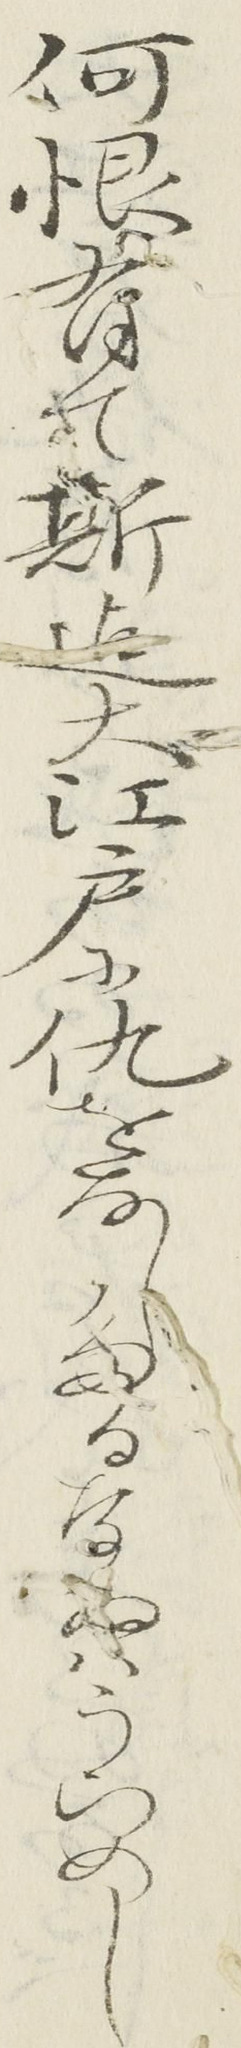何恨有て斯迄大江戸に仇をなしたるなゐハうらめし
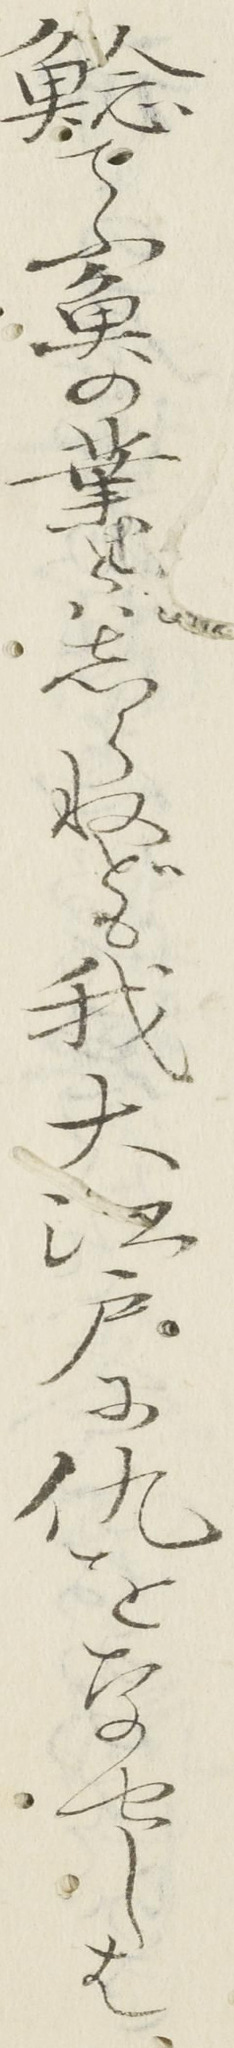鯰てふ魚の業とハしらねども我大江戸に仇をなセしは
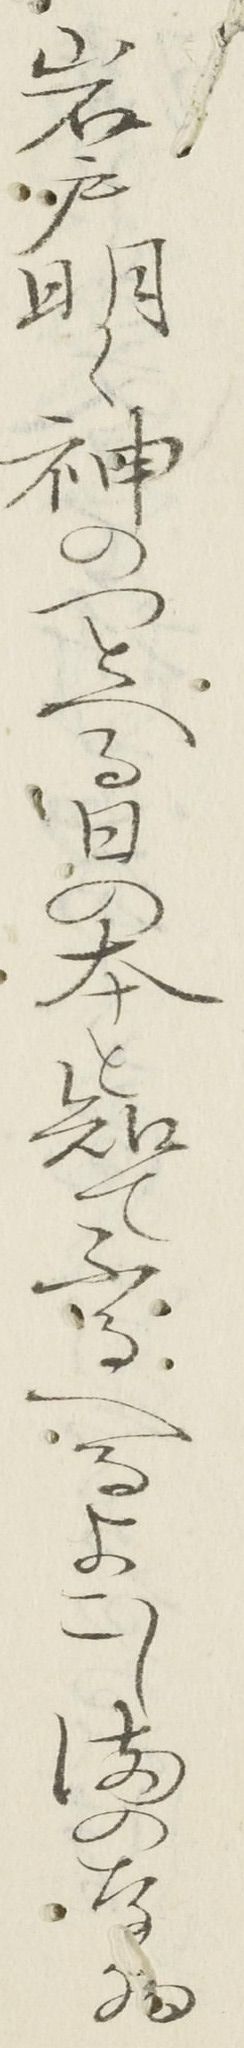岩戸明〳〵神のつとへる日の本と知てふるへるよこしまのなる
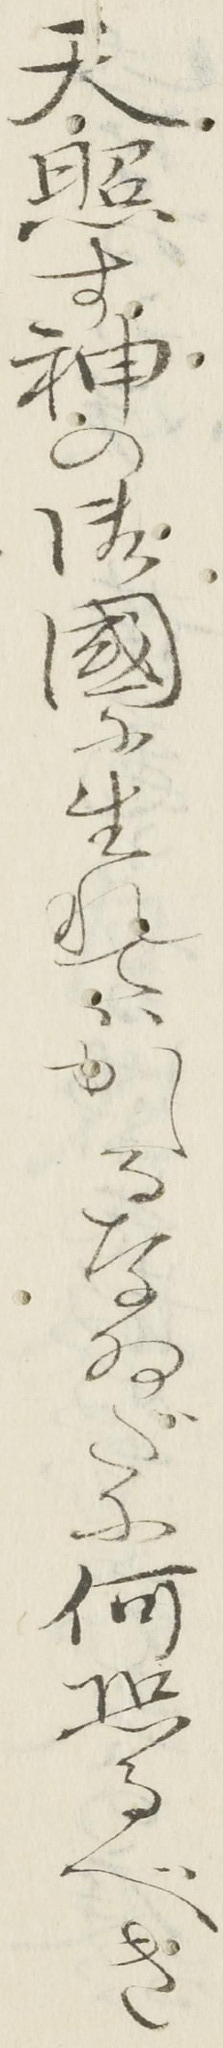天照す神の御国に生れてハかゝるなゐだに何恐るべき
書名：地震考證　全
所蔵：東京大学地震研究所図書室 Earthquake Research Institute Library, The University of Tokyo, JAPAN
